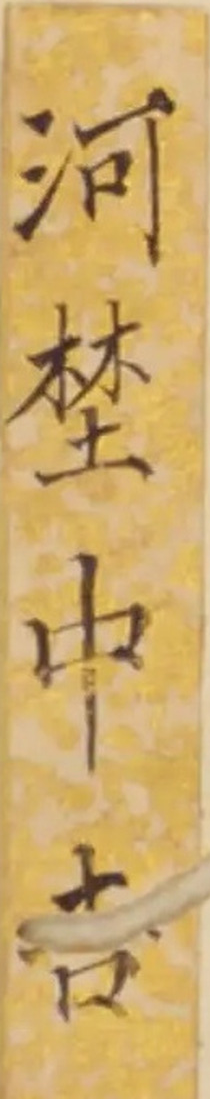河埜中吉

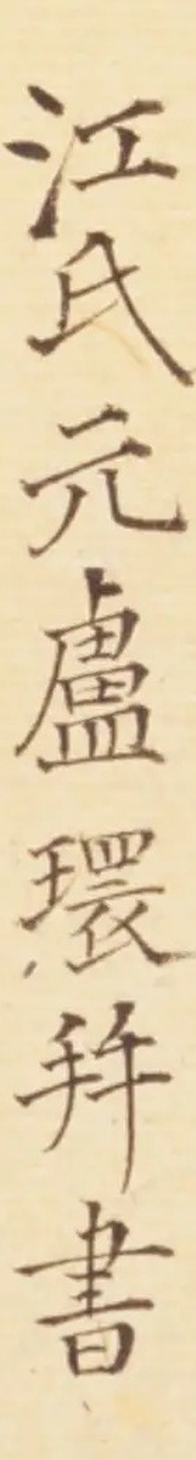江氏元盧環拝書
